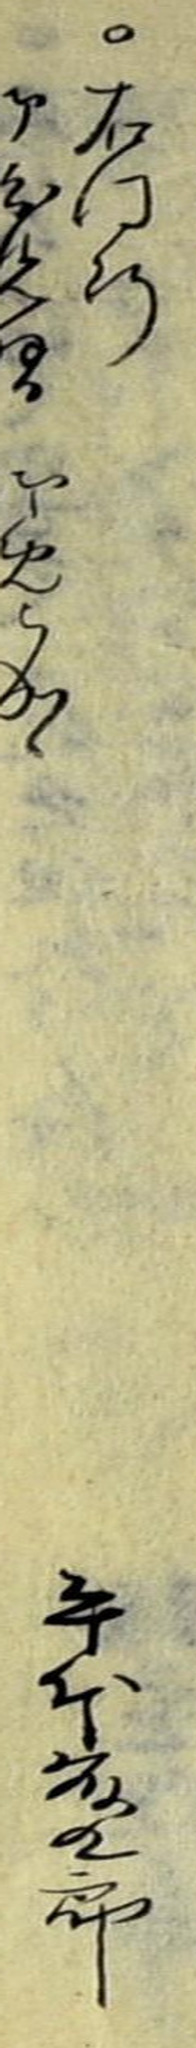御側見習御免被成候平本藤九郎
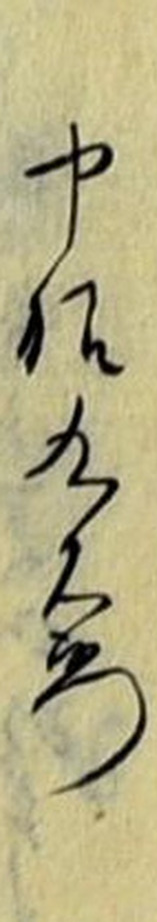中根九右衛門
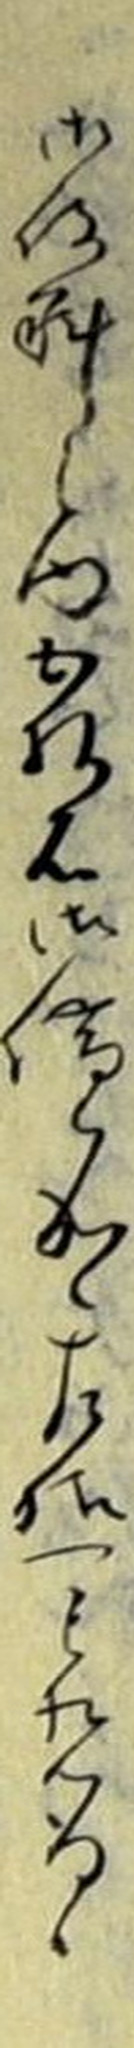御役料之内五拾石御借被成候左様可被相心得候
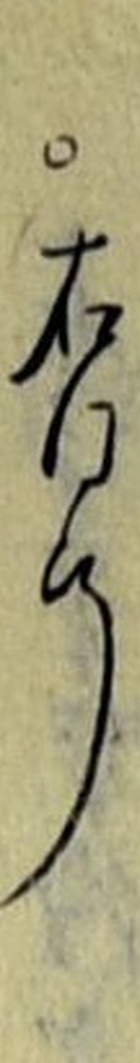〇右同断
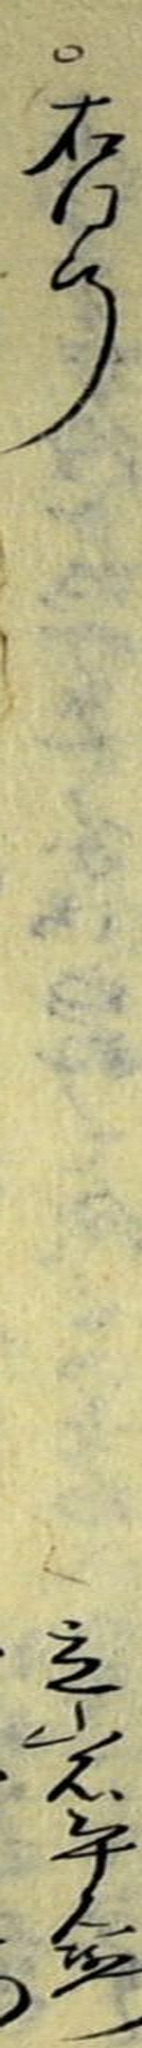〇右同断立岩平右衛門
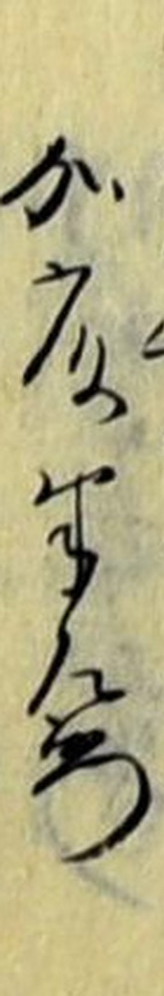加藤半左衛門
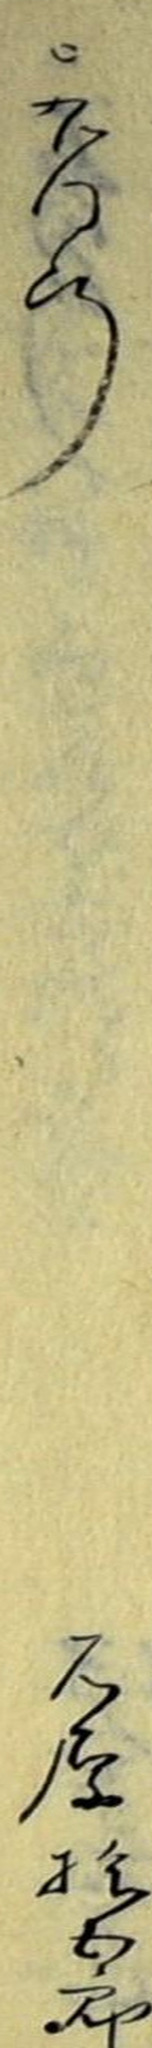〇右同断石原拾五郎

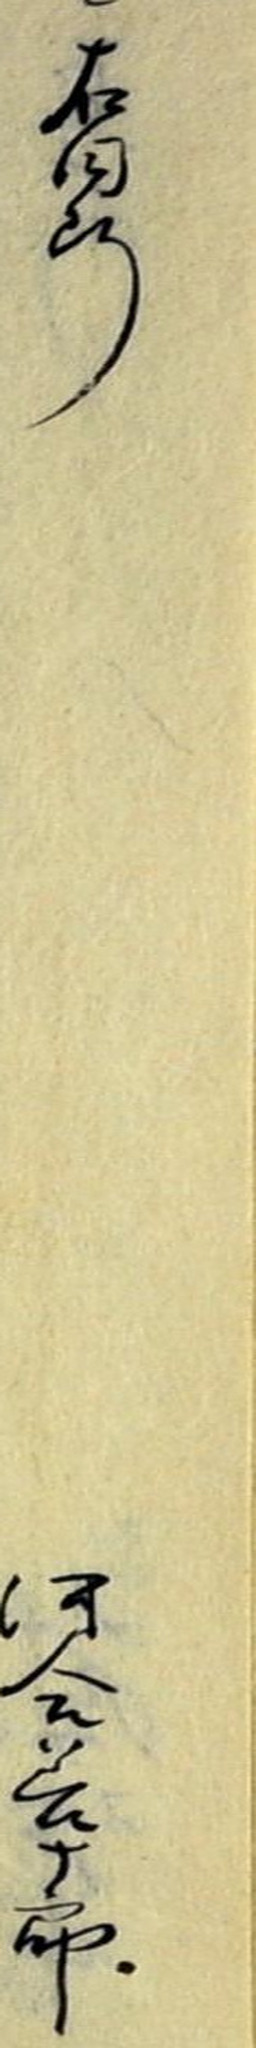〇右同断河合善十郎
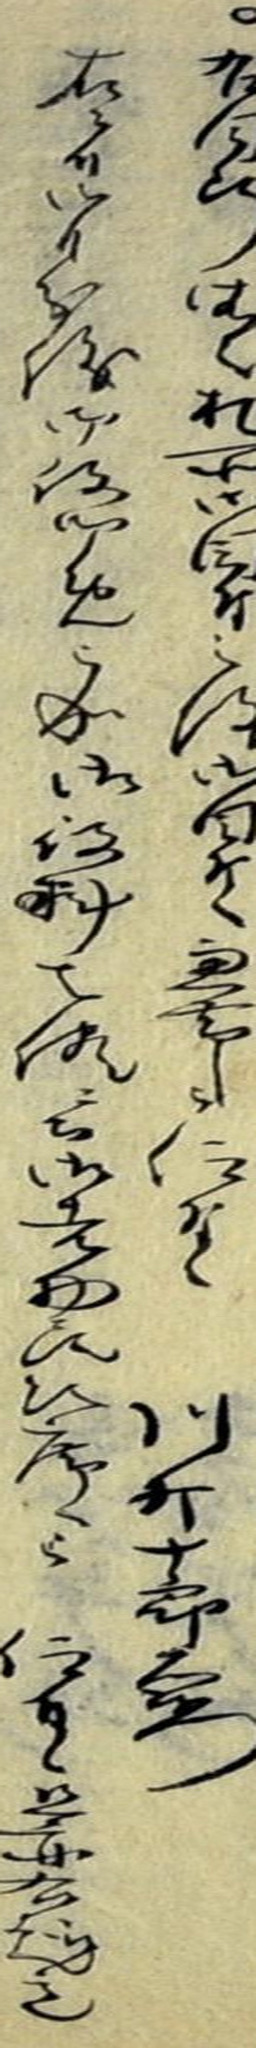右に付御自分儀御役御免被成御役料其侭に而御先物頭次席へ被仰付候且亦右趣意
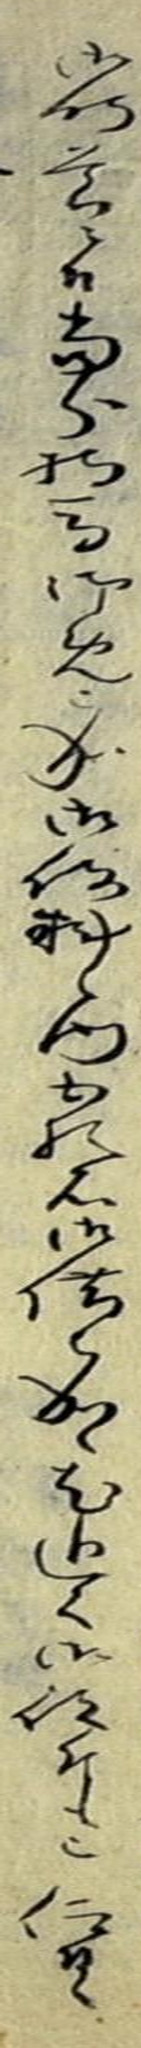御時節に付当分持馬御免被成御役料之内五拾石御借被成候尤追々御役付も被仰付候
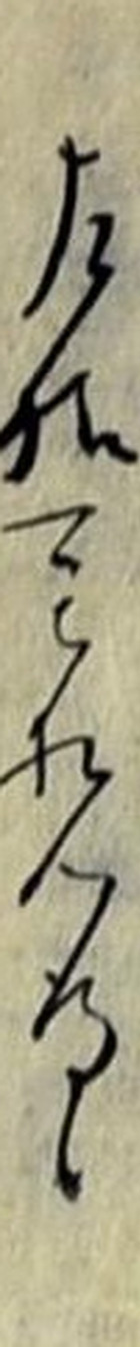左様可被相心得候
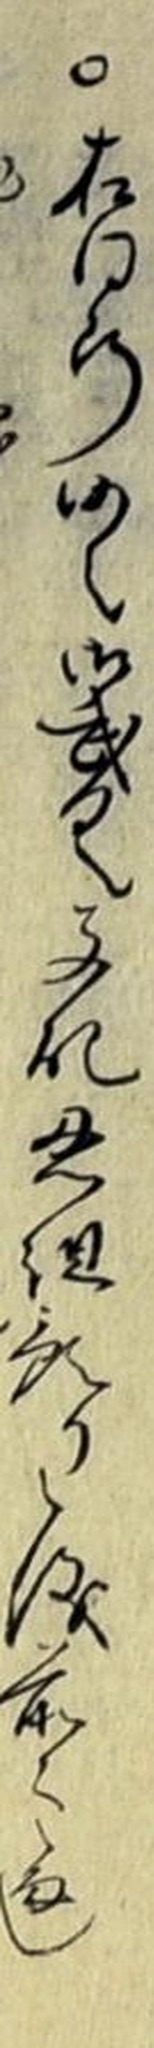〇右同断仍之御武具支配忍組預り之儀前々之通
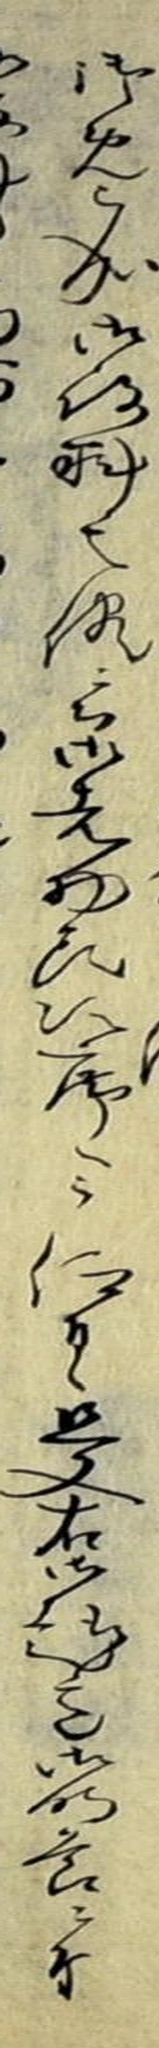御免被成御役料其侭に而御先物頭次席へ被仰付候且又右御趣意御時節に付
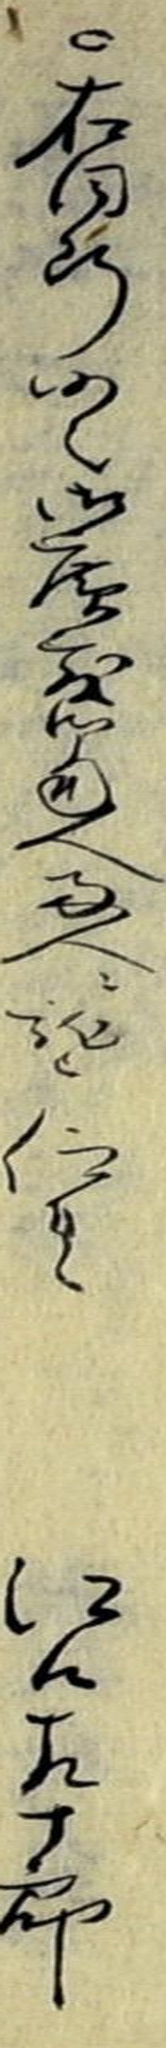〇右同断仍之御広敷御用人両人に然被仰付候江口左十郎
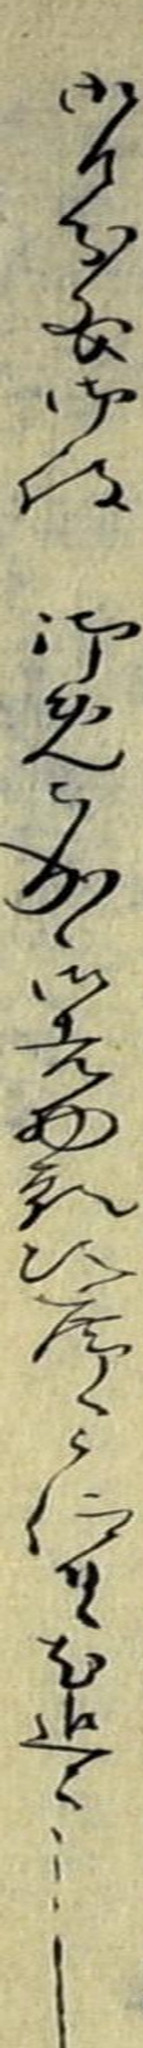御自分義御役御免被成候御先物頭次席へ被仰付候尤追々・・ーーー
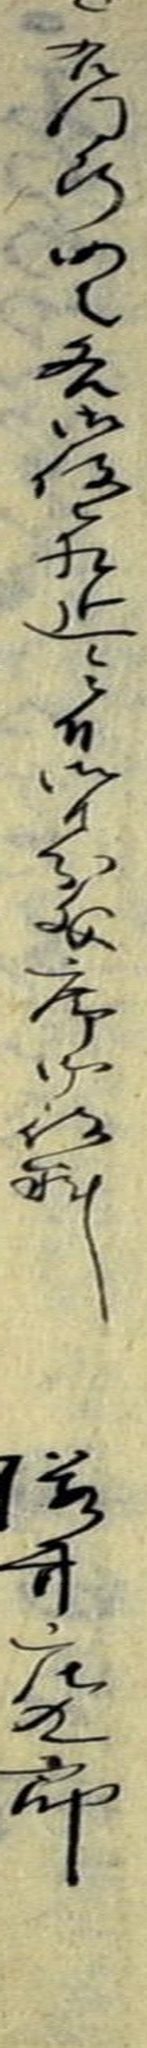〇右同断仍之右御役被相止候に付御自分義席御役料桜井庄九郎
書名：命令之部 二
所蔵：福井県文書館 Fukui Prefectural Archives
